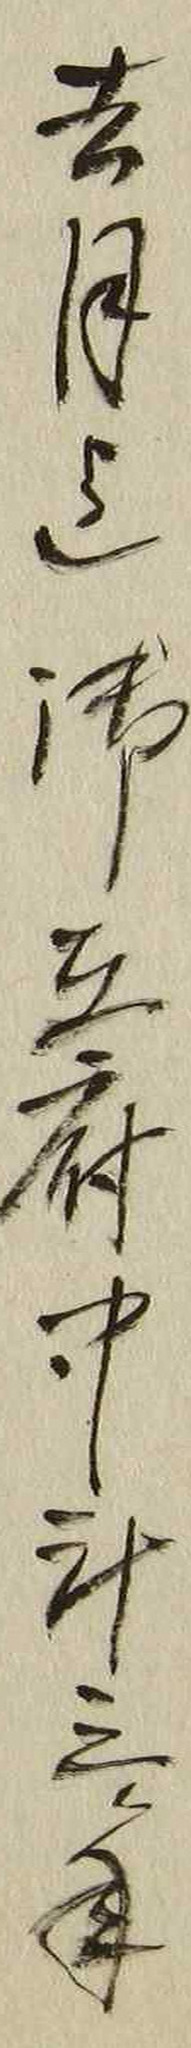去月迄御在府中計三ケ年
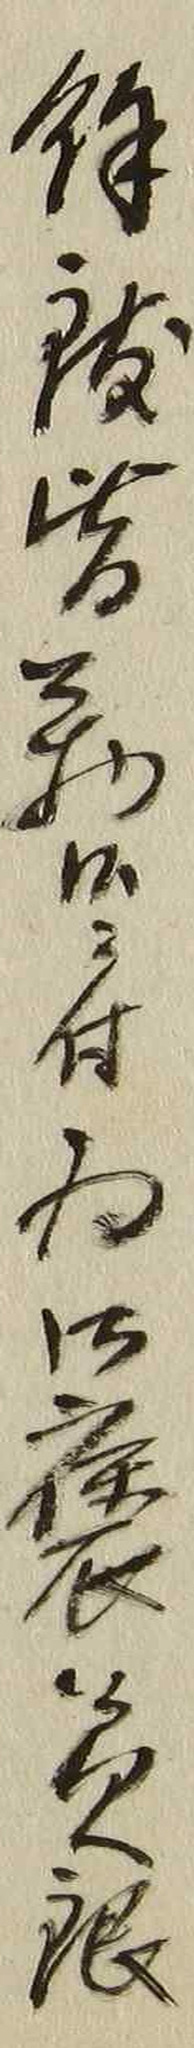余致皆勤候ニ付為御褒美銀
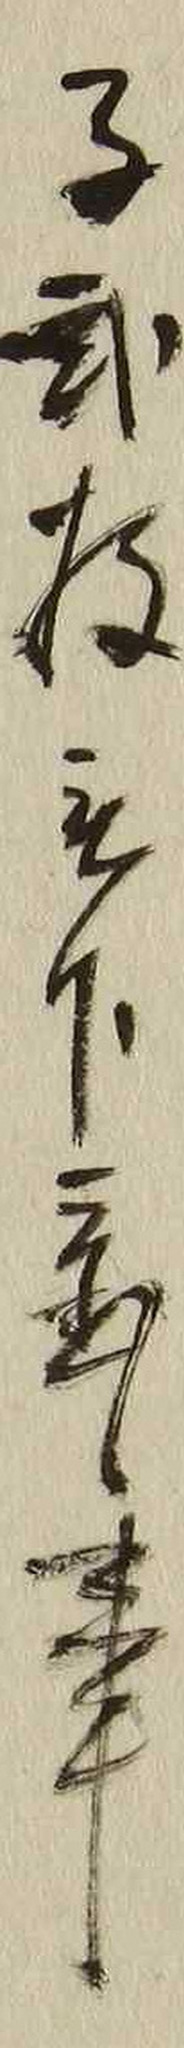子弐枚被下置候事
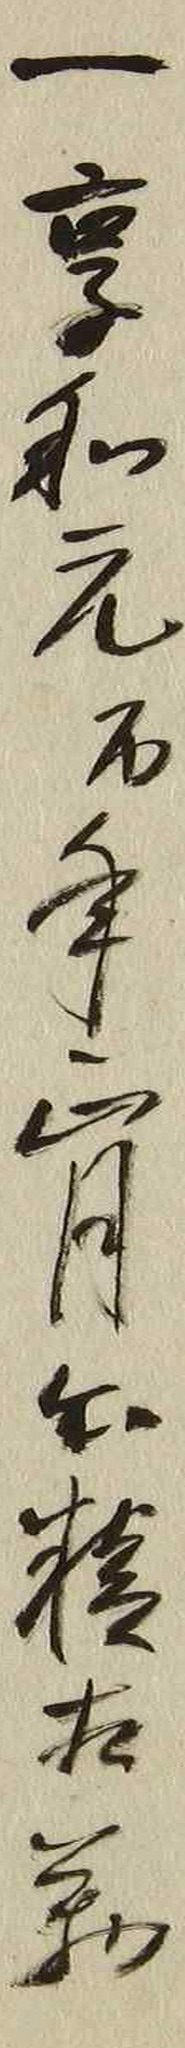一享和元酉年正月出精相勤
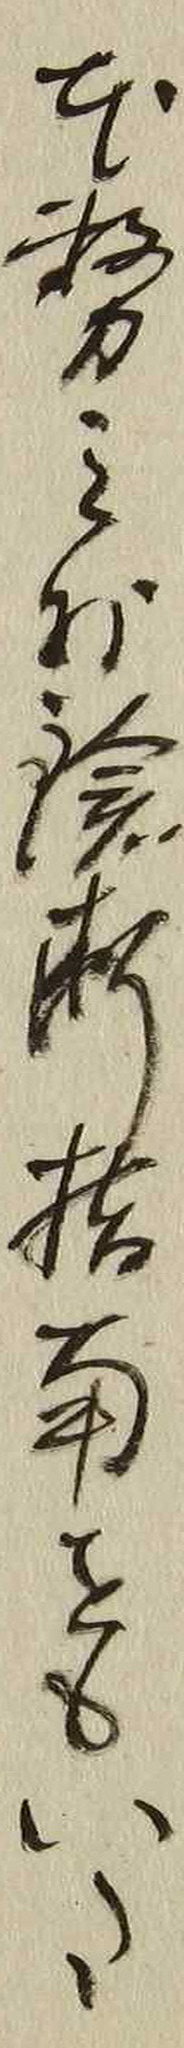本務之外鎗術指南をもいた
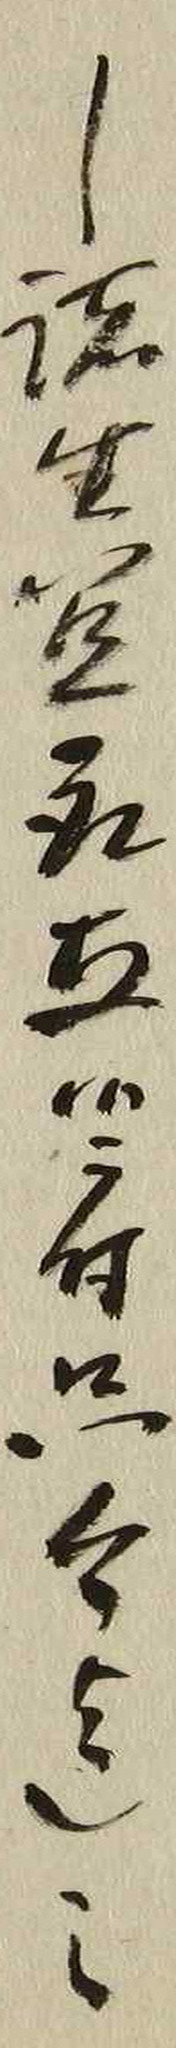し諸生宜取立候ニ付只今迄之
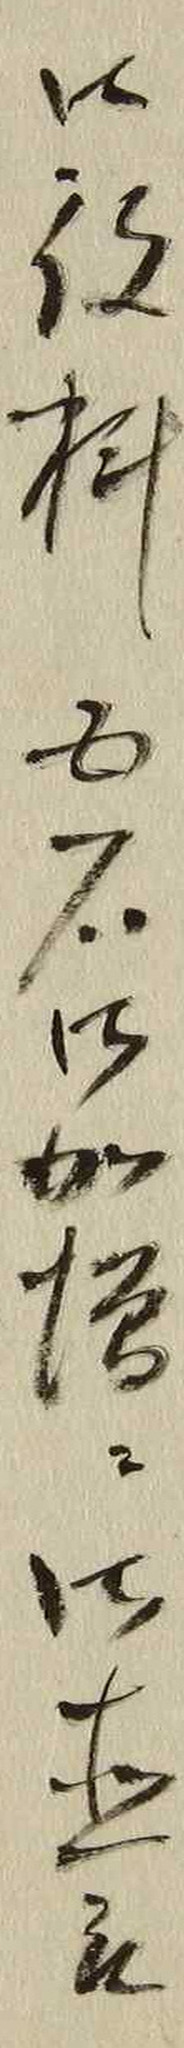御役料五石御加増ニ御直被
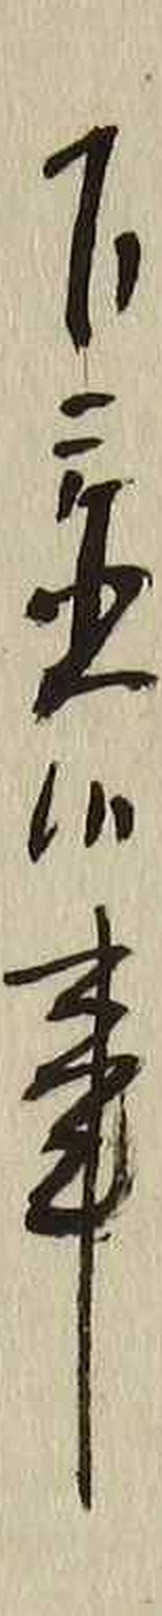下置候事
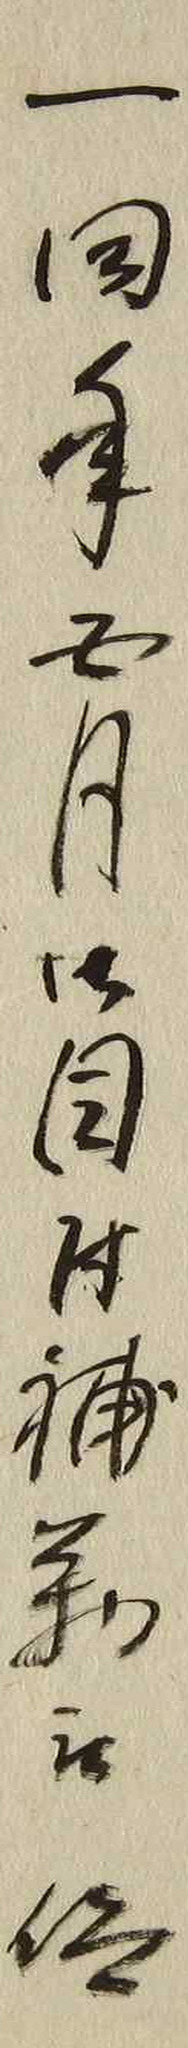一同年五月御目付補勤被仰
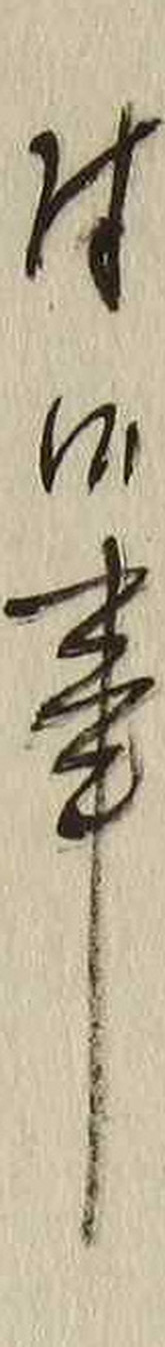付候事
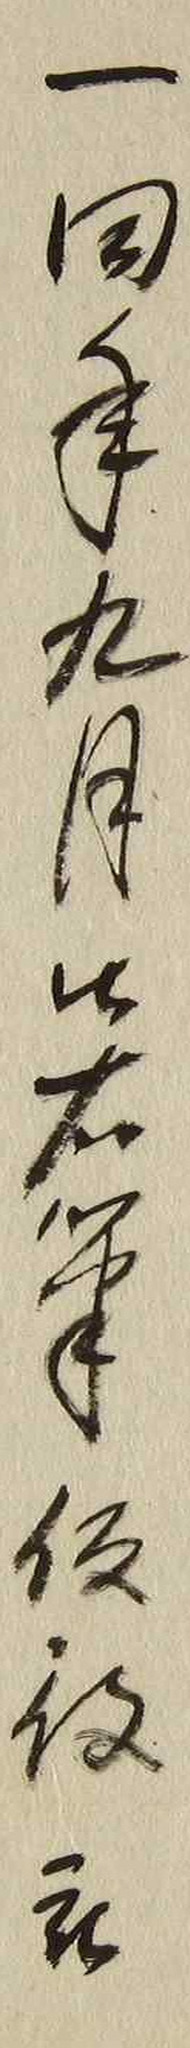一同年九月御右筆仮役被
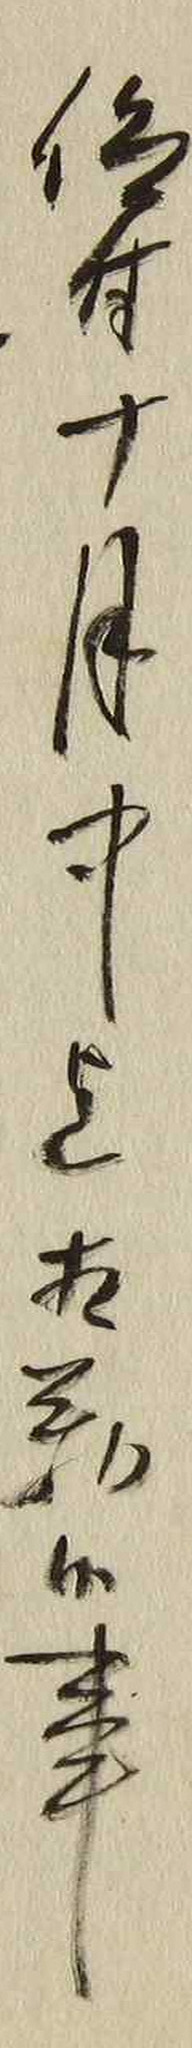仰付十月中迄相勤候事
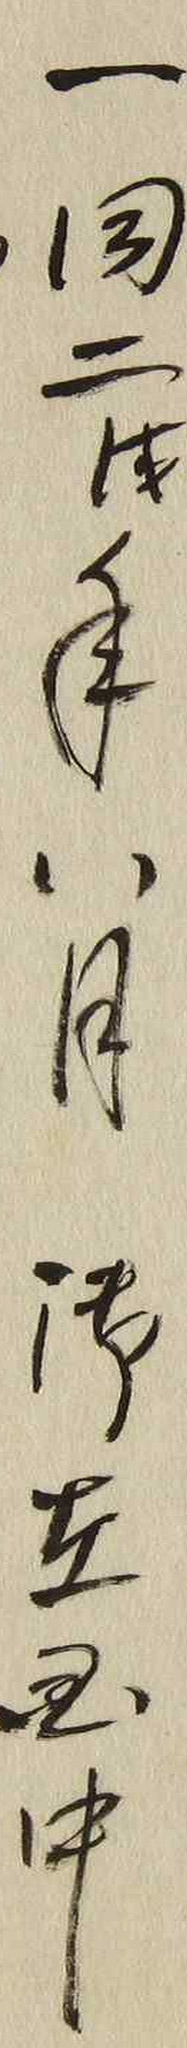一同二戌年八月御在国中
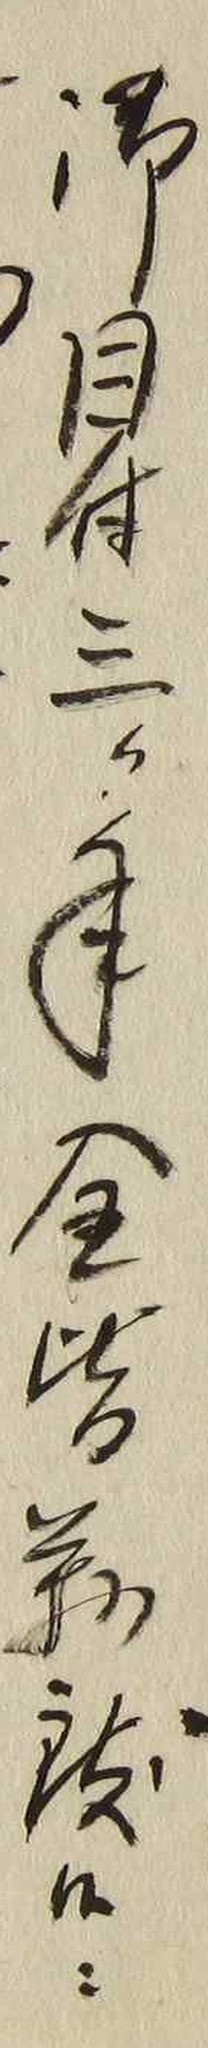御目付三ケ年全皆勤致候ニ
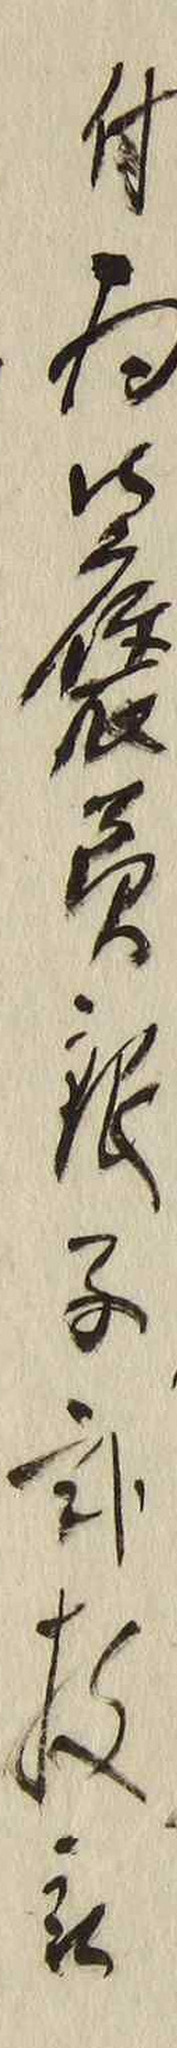付為御褒美銀子弐枚被
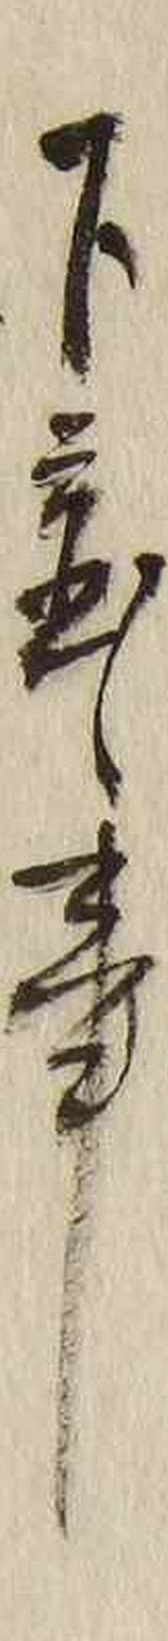下置候事
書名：諸士系譜　巻之359　す之部9
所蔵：会津若松市立会津図書館
